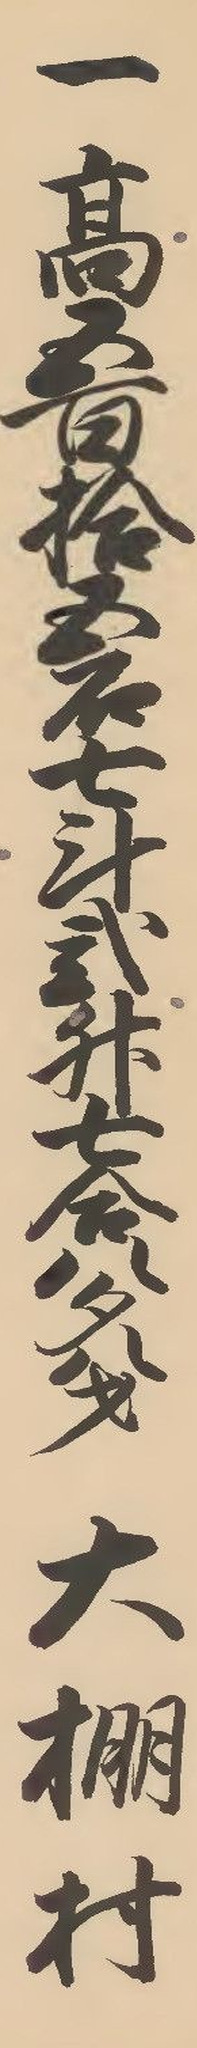一高五百拾五石七斗弐升七合八勺八才大棚村
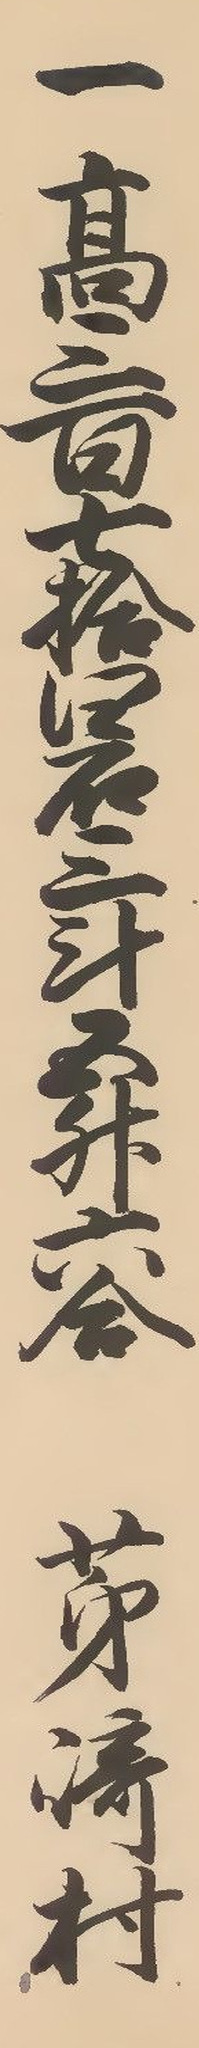一高三百七拾四石三斗五升六合茅崎村
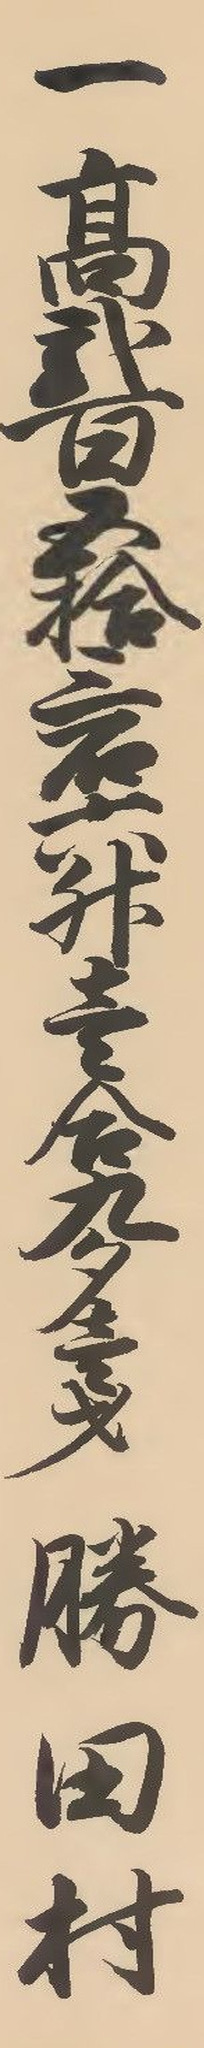一高弐百五拾三石六升壱合九勺壱才勝田村
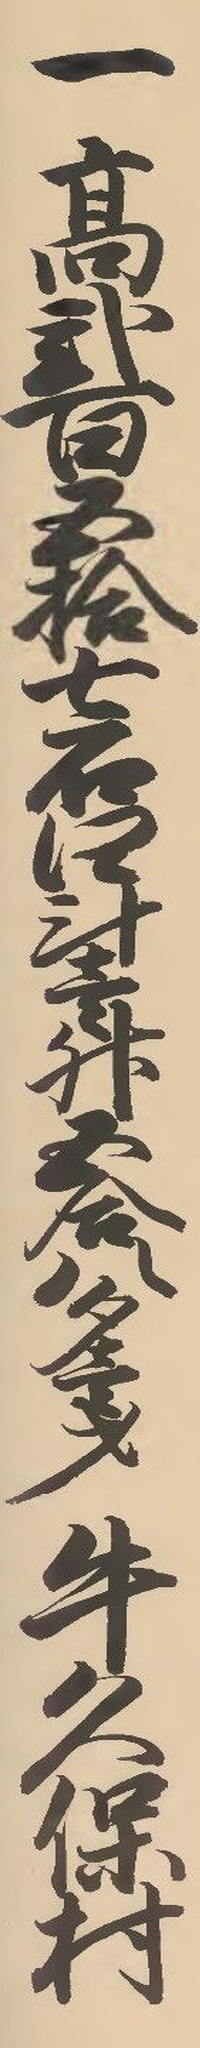一高弐百五拾七石四斗壱升五合八勺壱才牛久保村
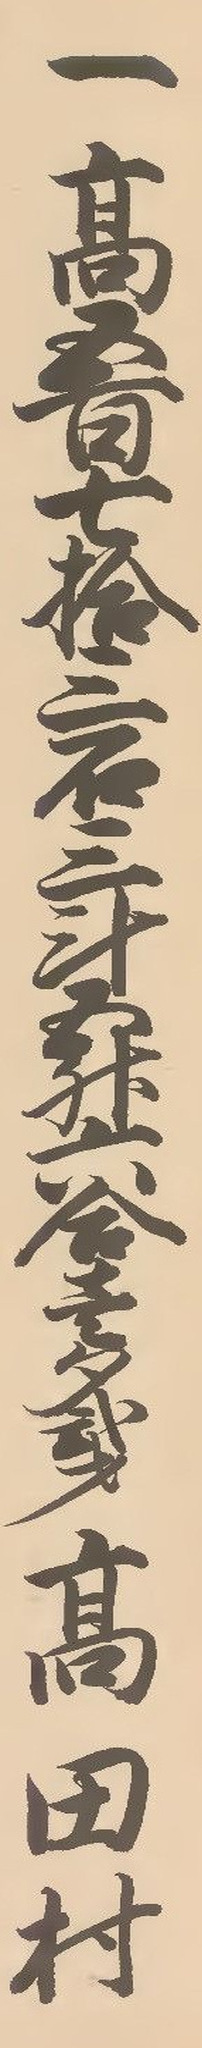一高五百七拾三石三斗五升六合壱勺弐才高田村
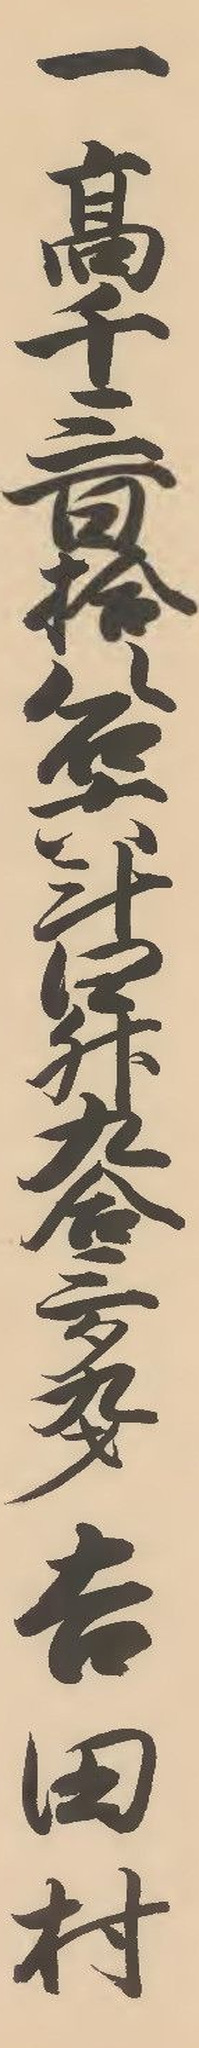一高千三百拾八石六斗四升九合三勺九才吉田村
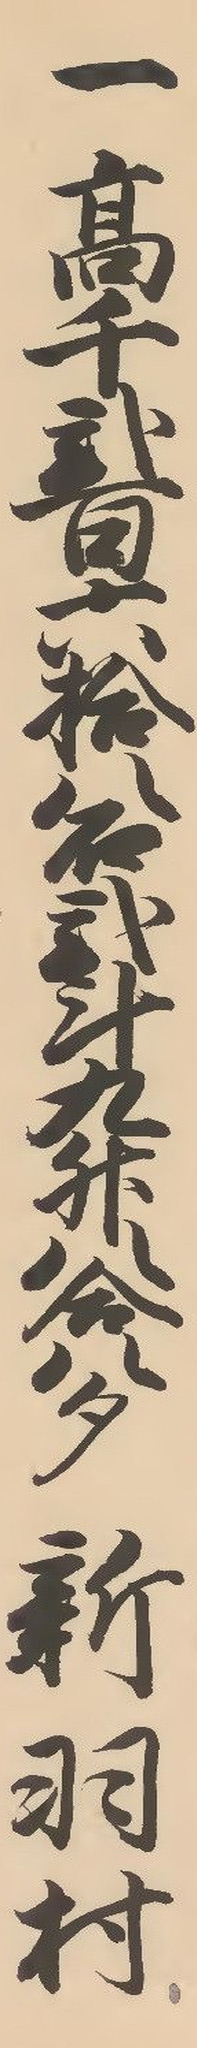一高千弐百六拾八石弐斗九升八合八勺新羽村
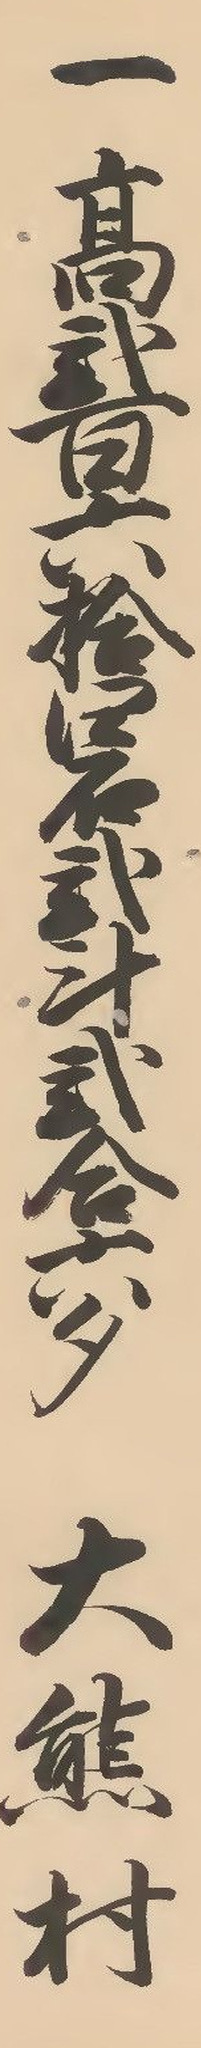一高弐百六拾四石弐斗弐合六勺大熊村

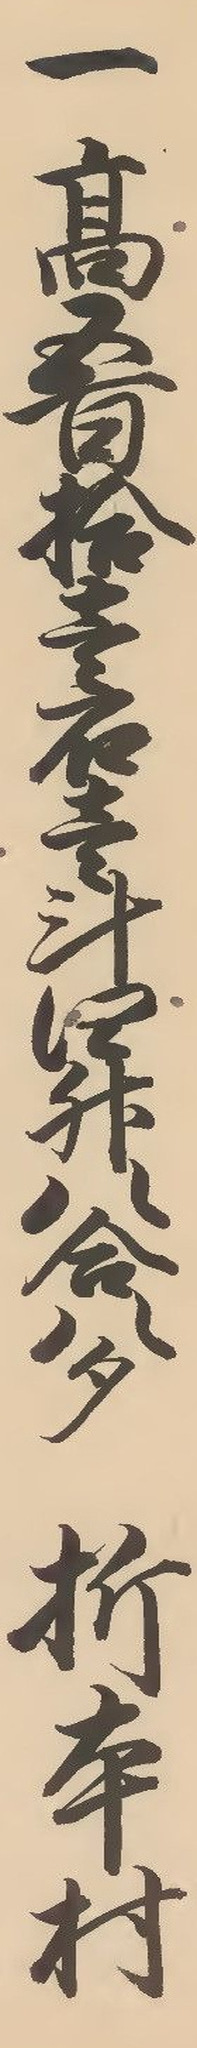一高五百拾壱石壱斗四升八合八勺折本村
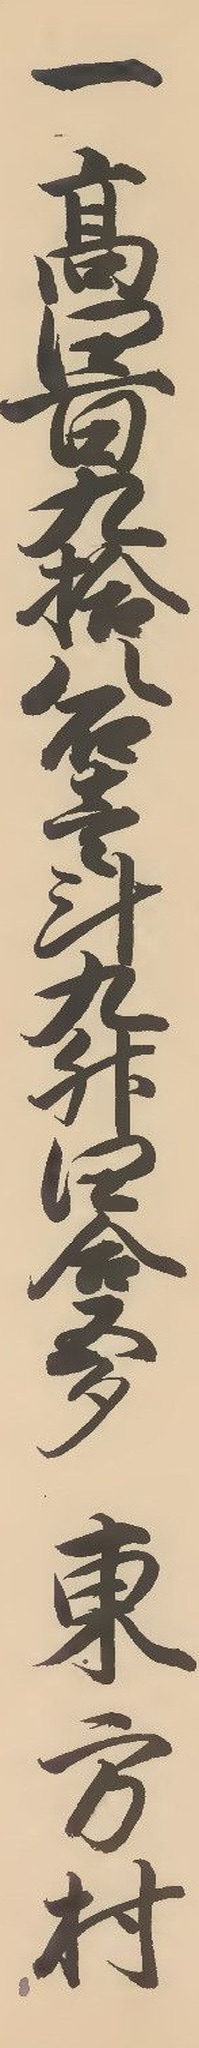一高四百九拾八石壱斗九升四合五勺東方村
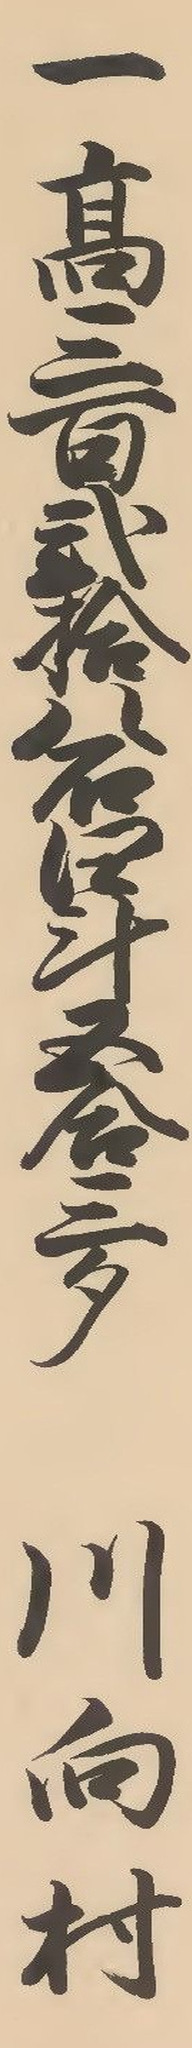一高三百弐拾八石四斗五合三勺川向村
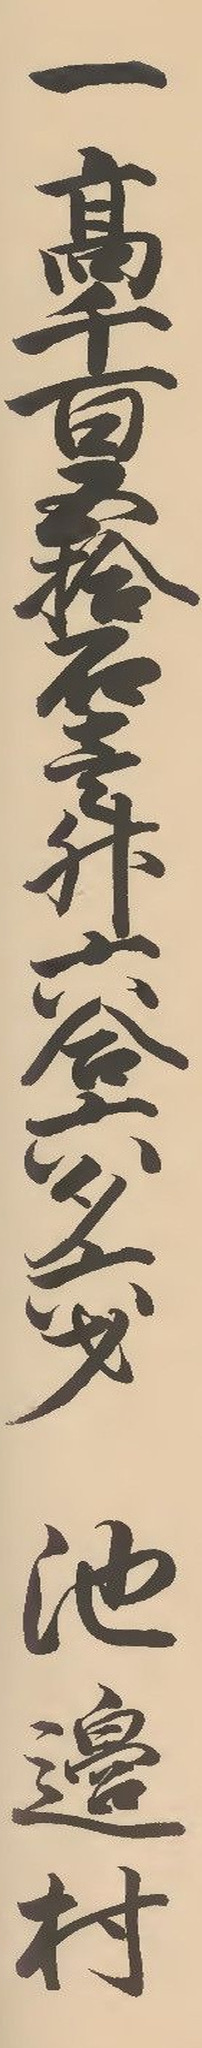一高千百五拾石壱升六合六勺六才池邉村
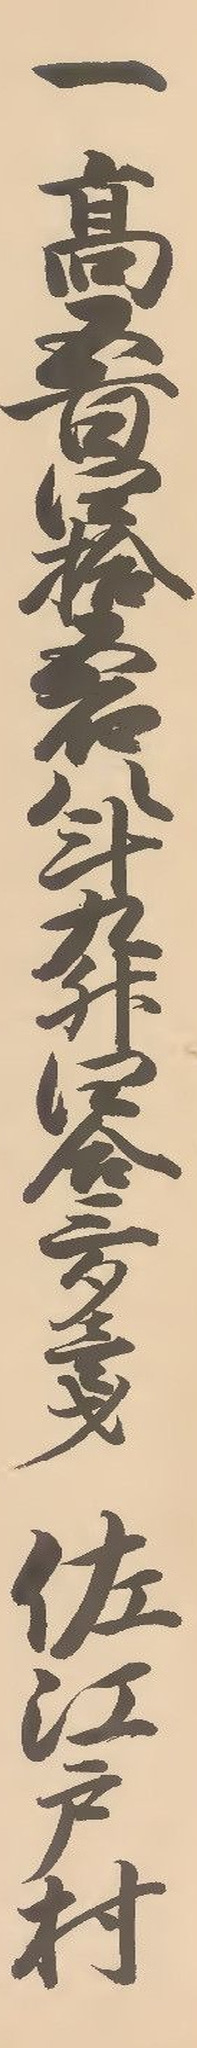一高五百四拾五石八斗九升四合三勺壱才佐江戸村
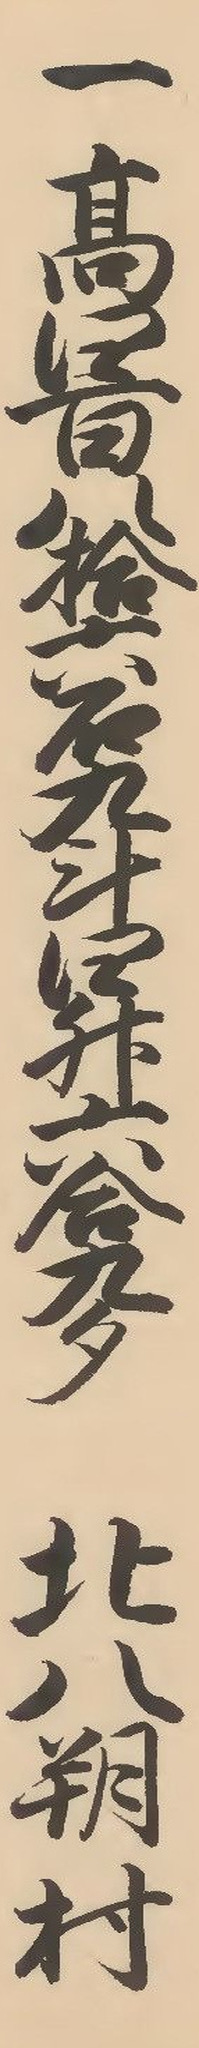一高四百八拾六石九斗四升六合九勺北八朔村
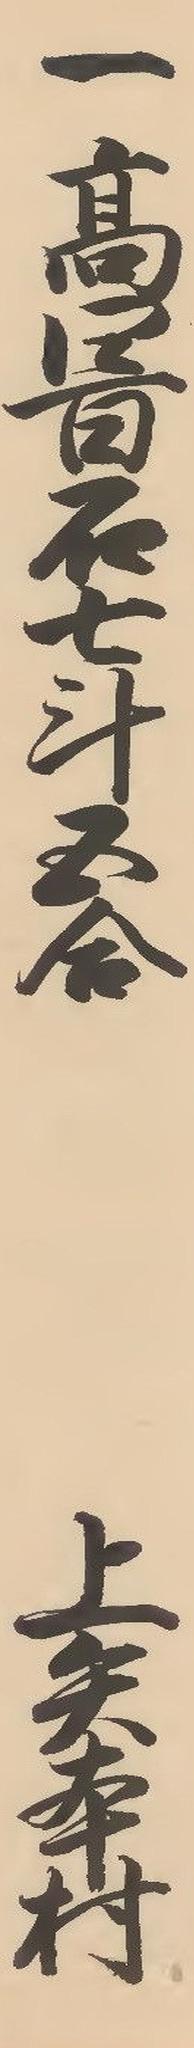一高四百石七斗五合上矢本村
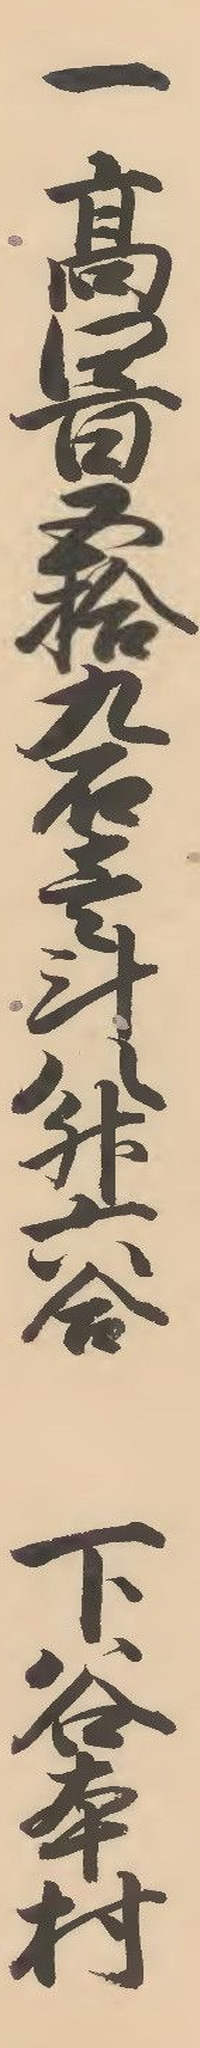一高四百五拾九石壱斗八升六合下谷本村
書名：武蔵国郷帳　上
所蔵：国立公文書館 National Archives of Japan
